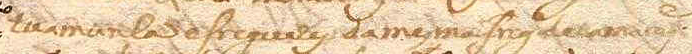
tuamunha e freguezes da mesma frega de camaraes.
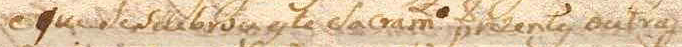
e que se selebrou este Sacram.to prezentes outras
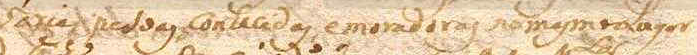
varias pesoas conhecidas, e moradoras no mesmo Lugar
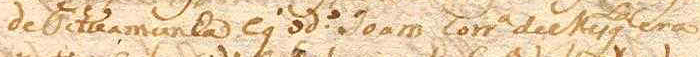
de Fetuamunha e q̄ o d.o Ioam Corra de Mesq.ta era
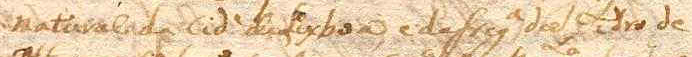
natural da Cid.e de Lisboa, e da freg.a de S Pedro de
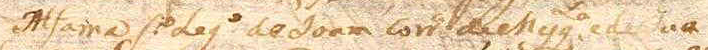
Alfama f.o Leg.o de Ioam Corr.a de Mesq.ta e de sua
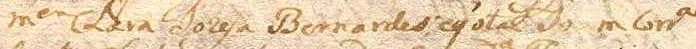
mer Clara Iozefa Bernardes; e q̄ o tal Io_m Corra
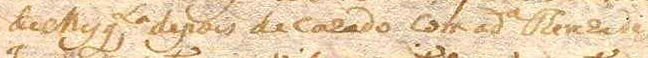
de Mesq.ta depois de cazado com a da Thereza de
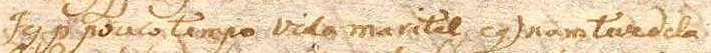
fes p pouco tempo vida marital, e q̄ nam teve dela
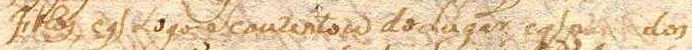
filhos, e q̄ Logo se auzentou do Lugar e q̄ __ dos
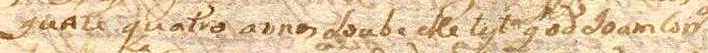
quaze quatro annos soube elle test.a q̄ o d̄. Ioam Corr.a
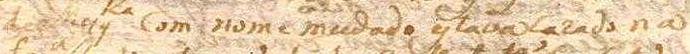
de Mesqta Com nome mudado estava cazado na
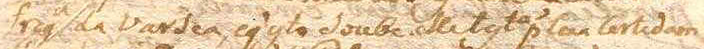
frega da varsea, e q̄ isto soube elle testa p̄ hua certidam
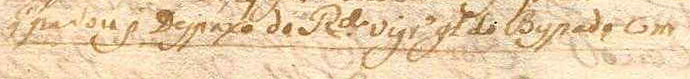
q̄ pasou o Despaxo do R.do vigr.o gl do Bispado Com
